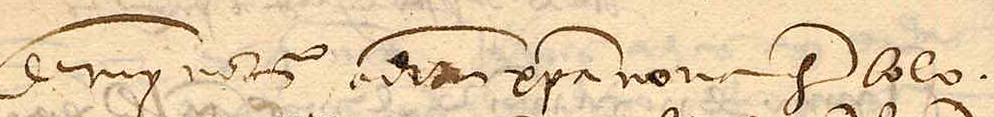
d̄emy notro a d̄ita xp̄a noua hū bolo.
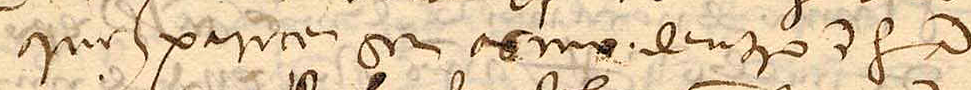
que pareçe ser asmo.dentro e̅ ha
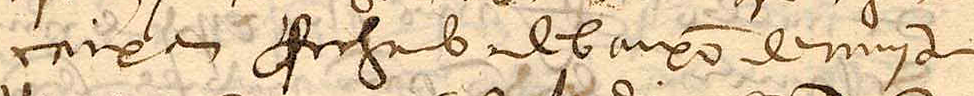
caixa fechado debaixo de mujta
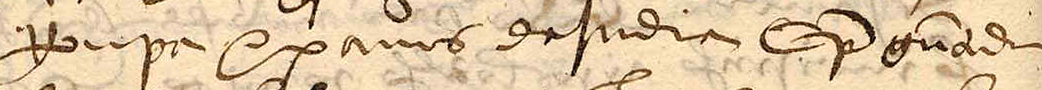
Roupa e panos da Jndia E p̄gūtada
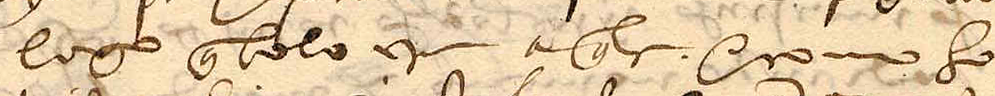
logo q̄ bolo era aq̄le e como ho
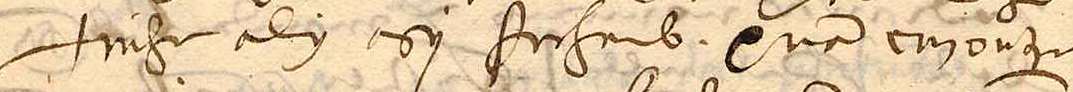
tinha aly asy fechado. e na̅ em outra
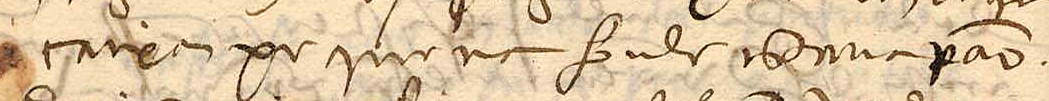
caixa pequena honde estaua pão
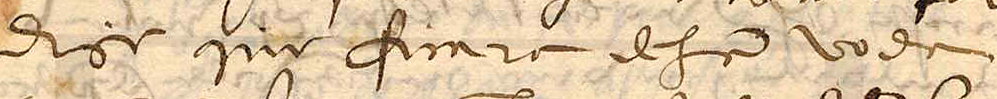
dise que ficara de ha̅ voda
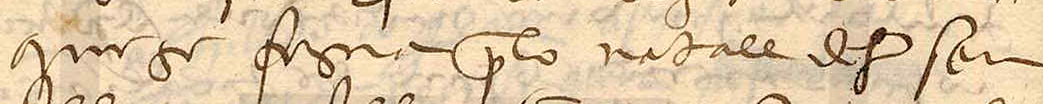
que se fizera p̄lo natall de hū seu
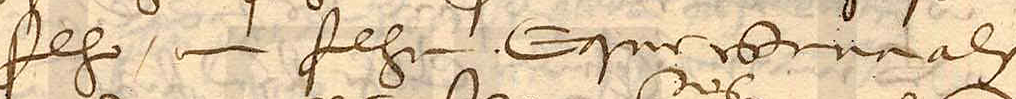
filho / ou flha. E que estaua aly
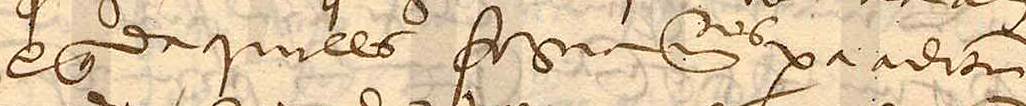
e q̄ daquelles fezera mtos ꝑa a dit̄a
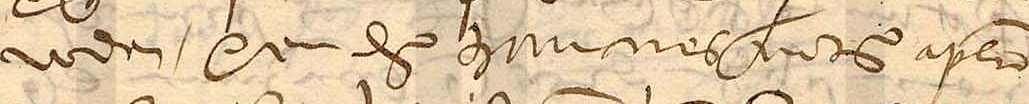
voda / e eu do trauaces noto apllo
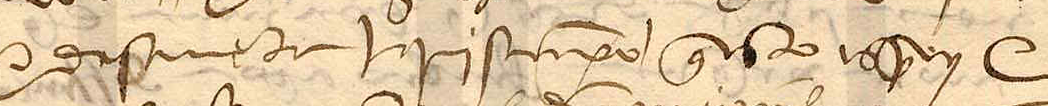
e da sancta Jnqujsisō q̄ esto esp̄vy e
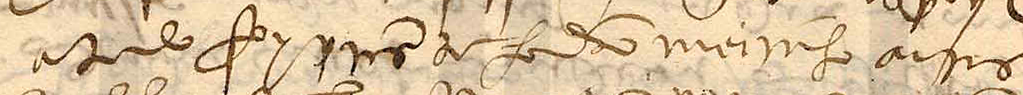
a todo foy presēte ho dt̄o meiynho aires
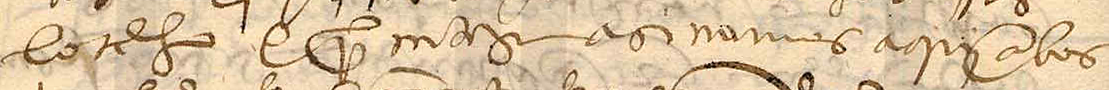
botelho e p̄setes asinamos aquj ābos
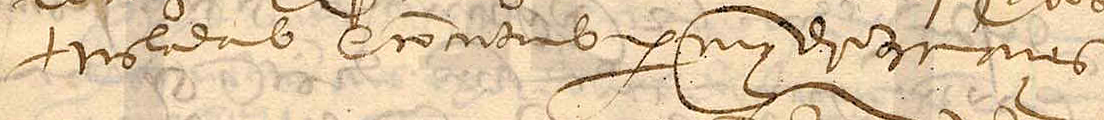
tresladado e c̄ocertado ꝓmj dio travaces
